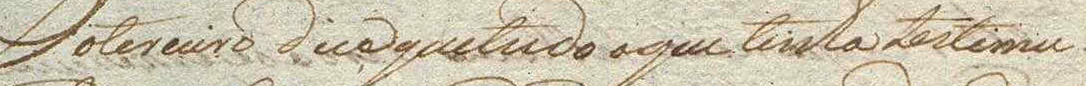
Do terceiro diçe que tudo o que tinha testimu
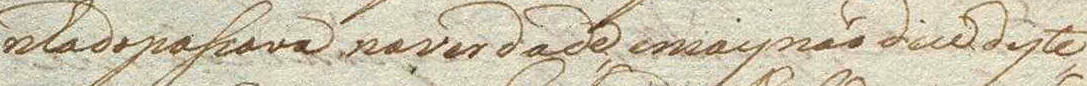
nhado passava na verdade, e mais naõ dice deste,
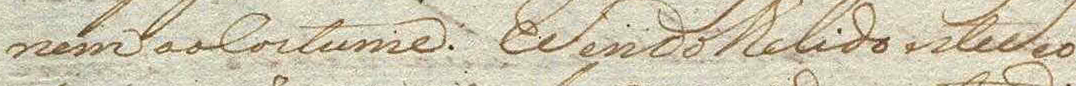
nem ao Costume. E Sendo lhe lido este Seo
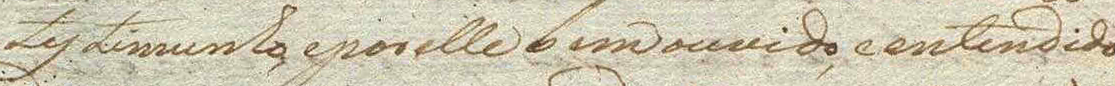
testimunho, e por elle bem ouvido, e entendido
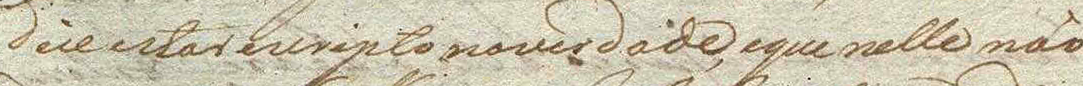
dice estar escripto na verdade, e que nelle não
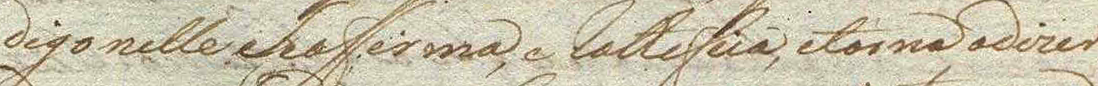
digo nelle Se affirma, e Rathefica, e torna a dizer
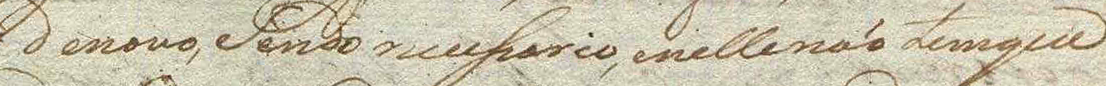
de novo, Sendo necessario, e nelle naõ tem que
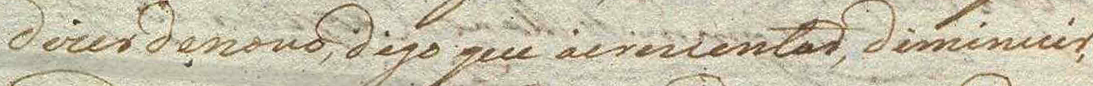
dizer de nouo, digo que acrescentar, diminuir,
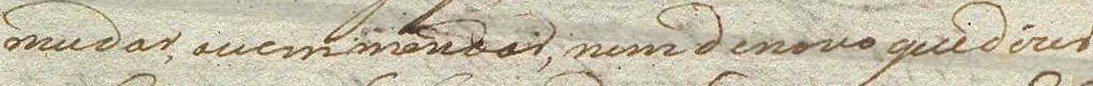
mudar, ou emmendar, nem de novo que dizer
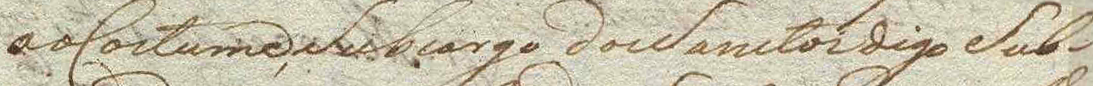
ao Costume, Sub cargo dos Sanctos digo Sub
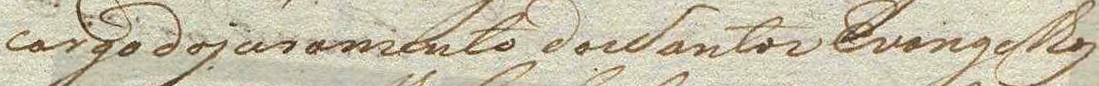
cargo do juramento dos Santos Evangelhos
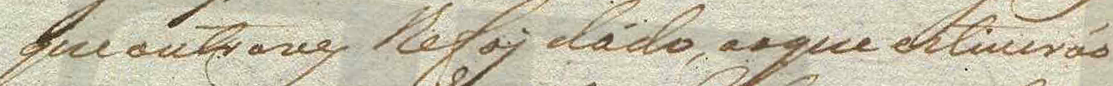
que outra ves lhe foj dádo, ao que estiueraõ
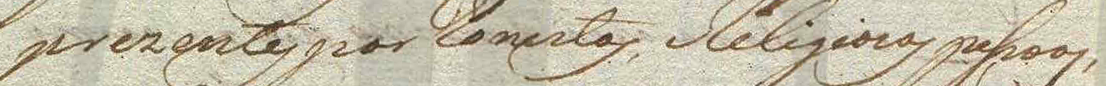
prezentes por honestas, Religiozas pessoas,
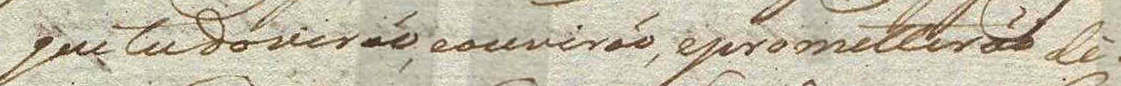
que tudo viraõ, e ouviraõ, e prometterão di
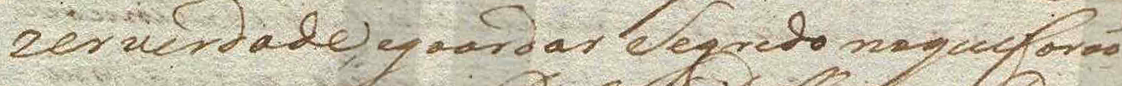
zer uerdade, e goardar Segredo no que foraõ
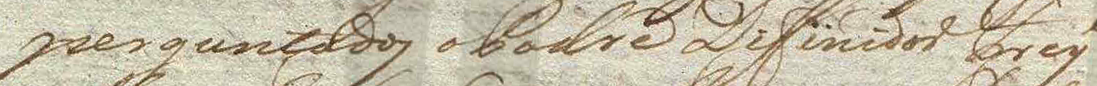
perguntados o Padre Diffinidor Freŷ
